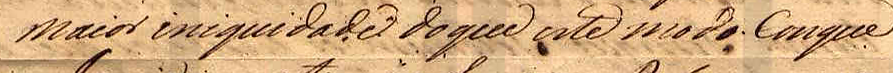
maior iniquidade do que este modo Con que
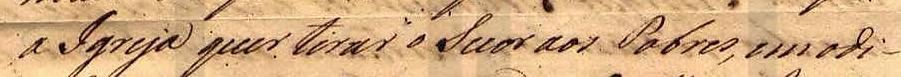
a Igreja quer tirar o Suor aos Pobres, em o di
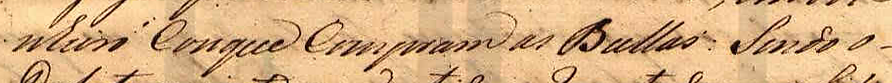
nheiro Con que Compram as Bullas, Sendo o
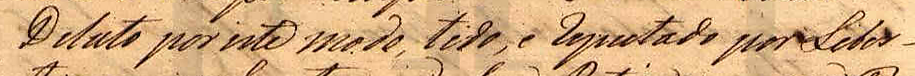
Delato por este modo, tido, e Reputado por Liber
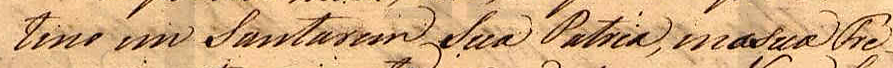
tino em Santarem Sua Patria, e na sua Fre
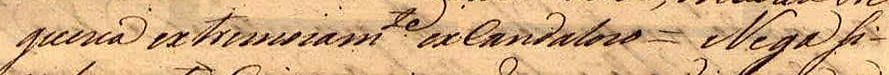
guezia extremozam.te exCandalozo = Nega fi
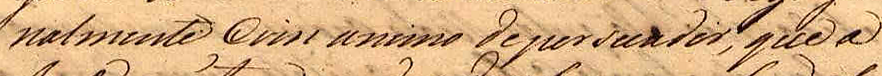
nalmente com animo de persuadir, que a
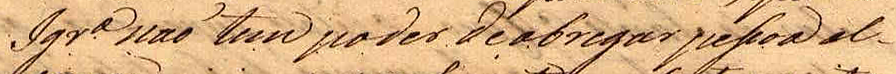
Igr.a naõ tem poder de obregar pessoa al
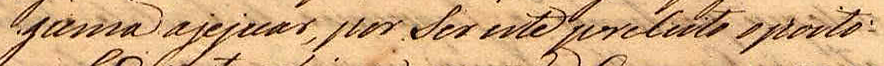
guma a jejuar, por ser este preCeito oposto
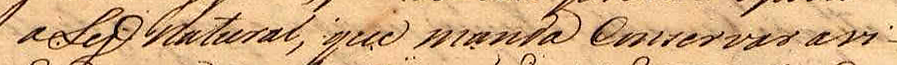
a Ley natural, que manda conservar a vi
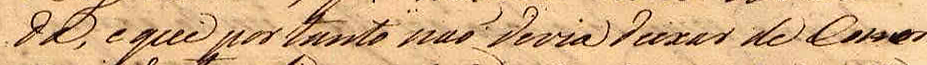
da, e que portanto naõ devia deixar de Comer
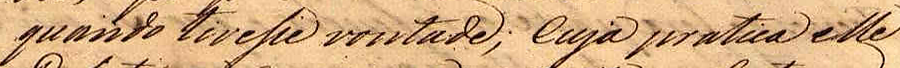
quando tivesse vontade; cuja pratica elle
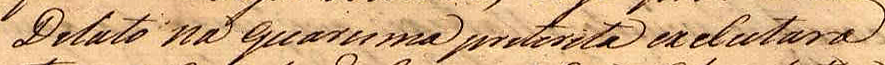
Delato na quaresma preterita exeCutara
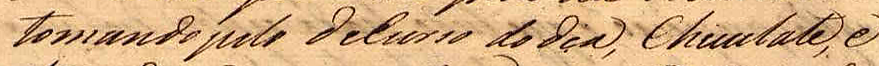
tomando pelo decurso do dia, Chiculate, e
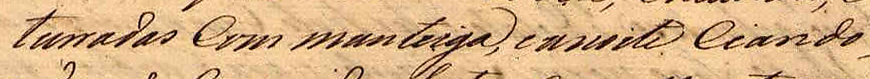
turradas Com manteiga, e a noite ciando
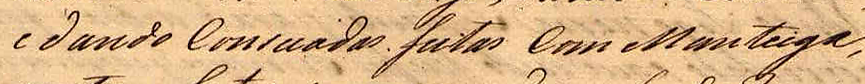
e dando Consuadas feitas com Manteiga,
